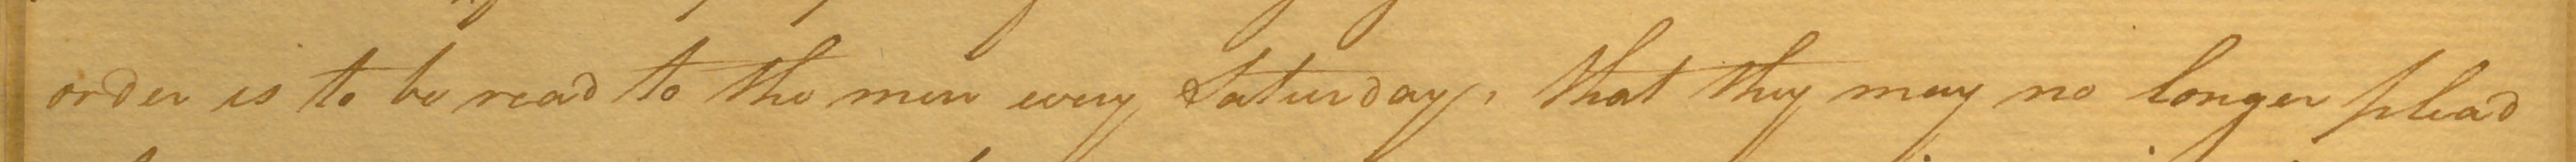order is to be read to the men every Saturday, that they may no longer plead
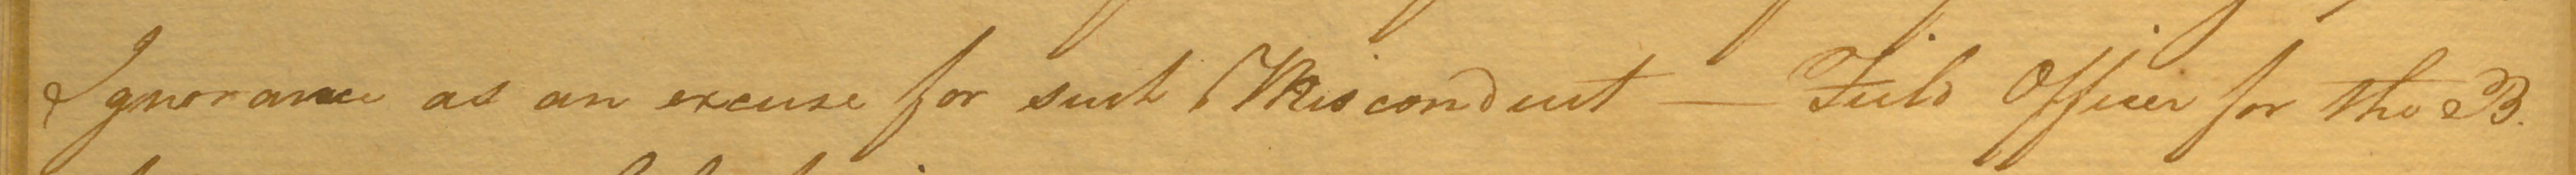Ignorance an excuse for such Misconduct- Field Officer for the B.
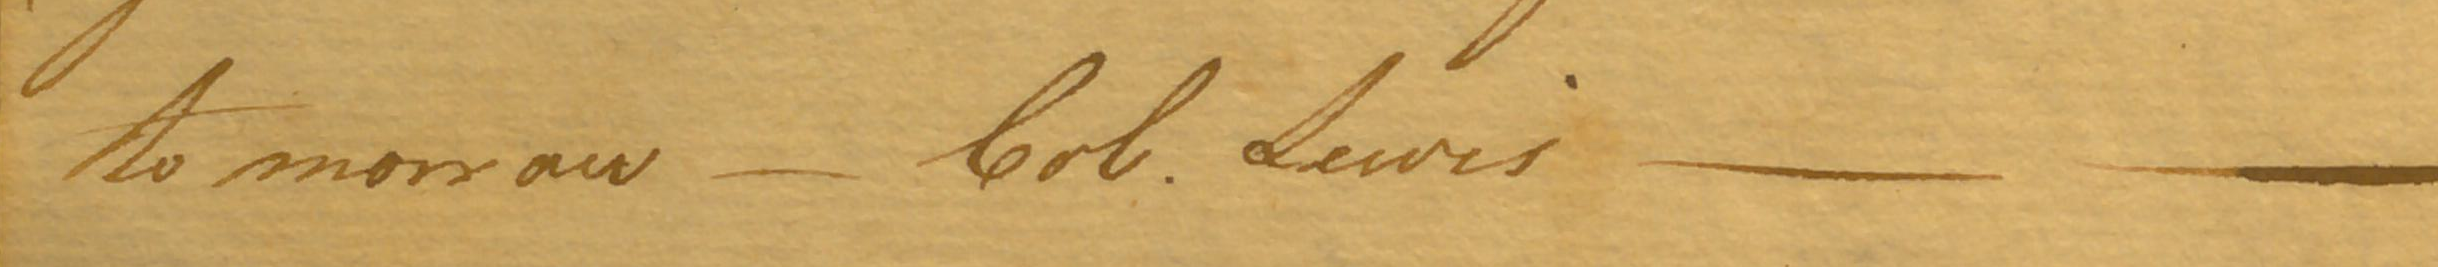to morrow- Col. Lewis-
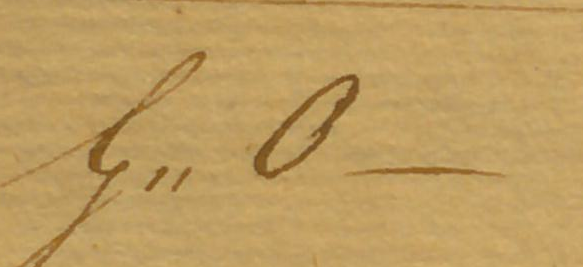G.O-
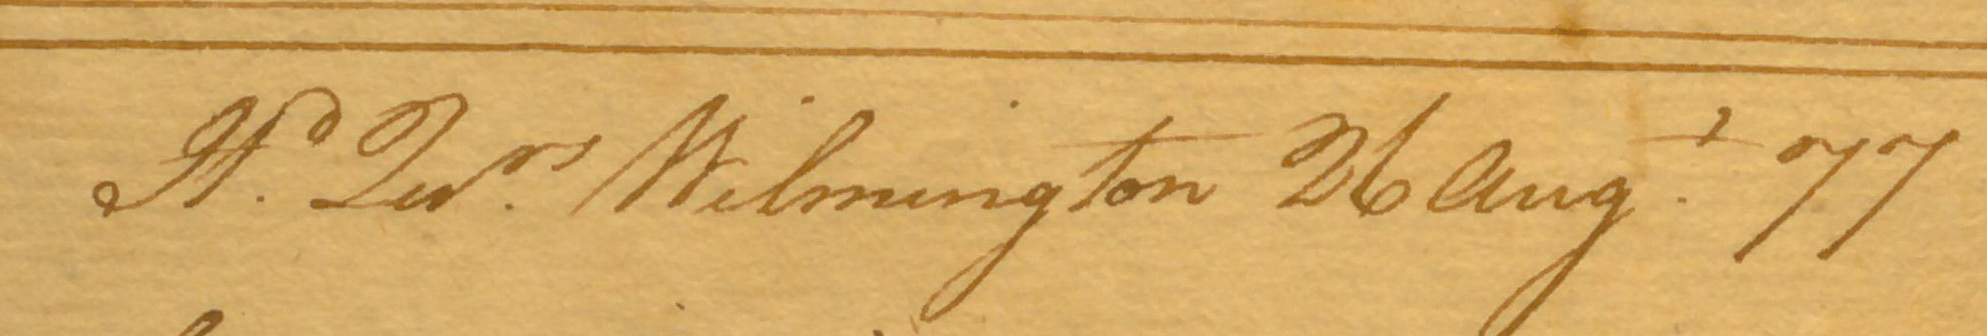H^d. Qu^rs. Wilmington 26 Aug^t. 77
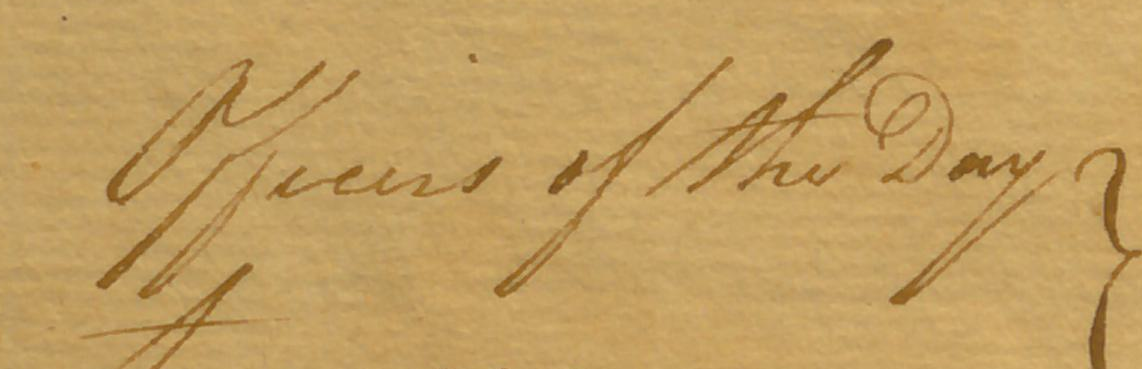Officers of the Day
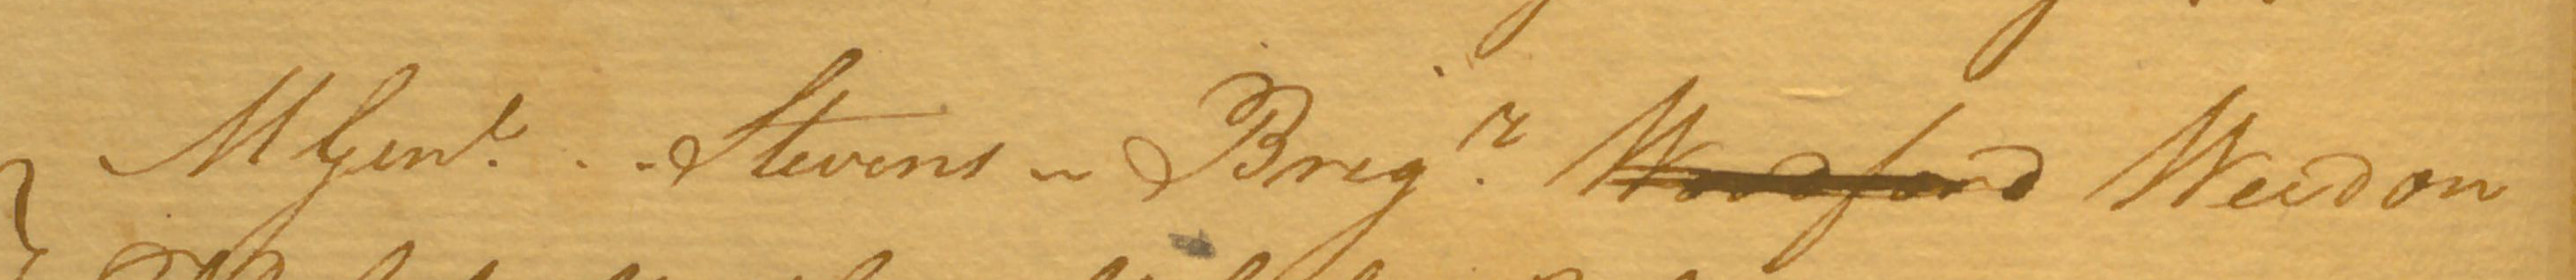M Gen^l. .. Stevens- Brig^r. [Woodford] Weedon
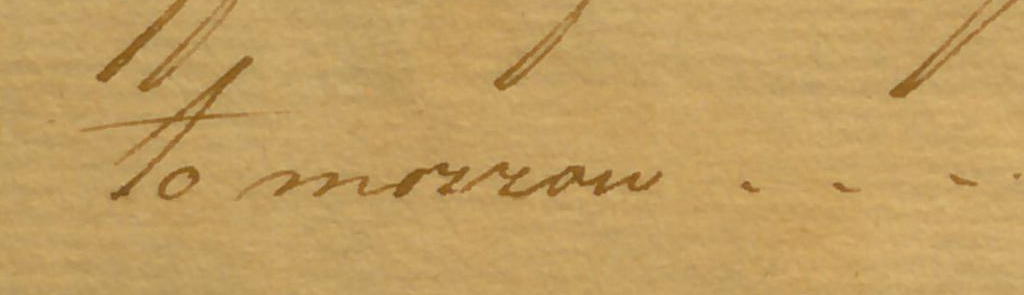to morrow...
